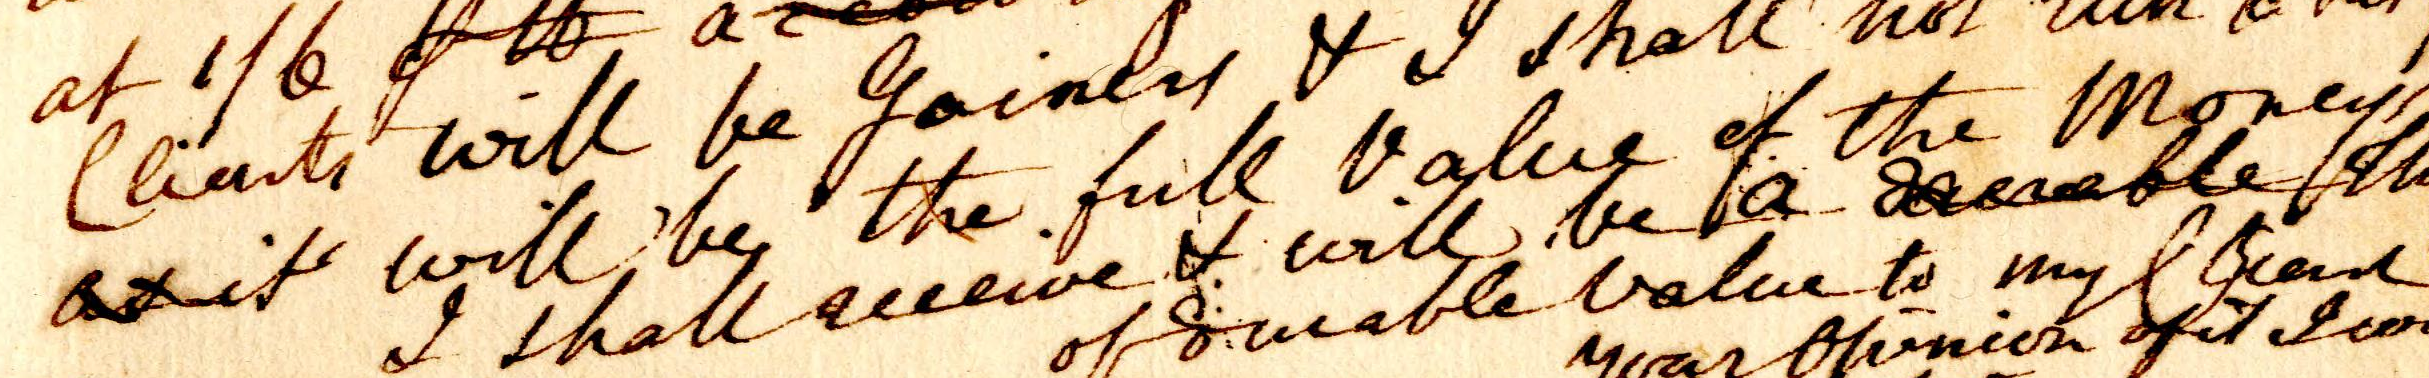at it will be the full Value of the Money.
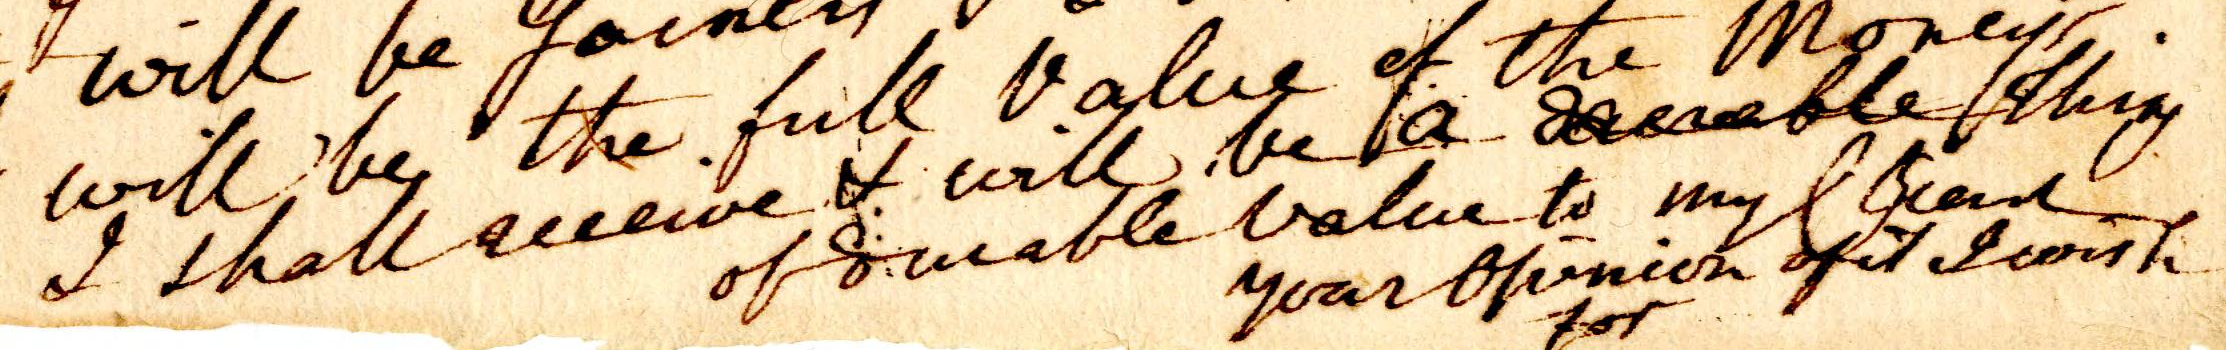I shall receive & will be a desirable thing
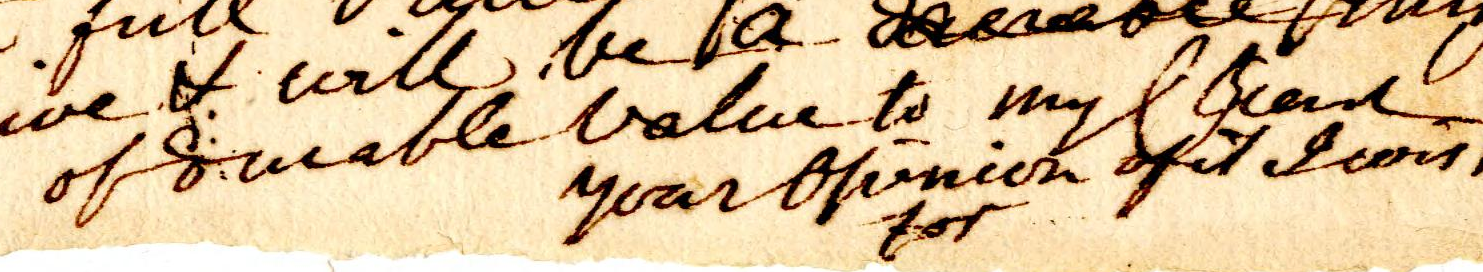of durable value to my Grand
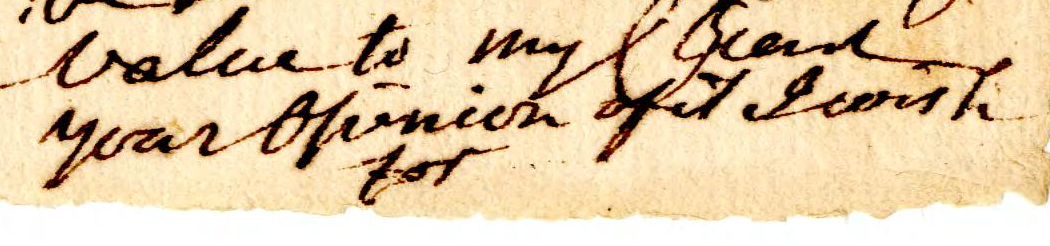your Opinion of it I wish
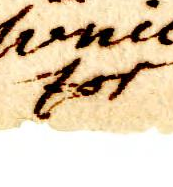for
